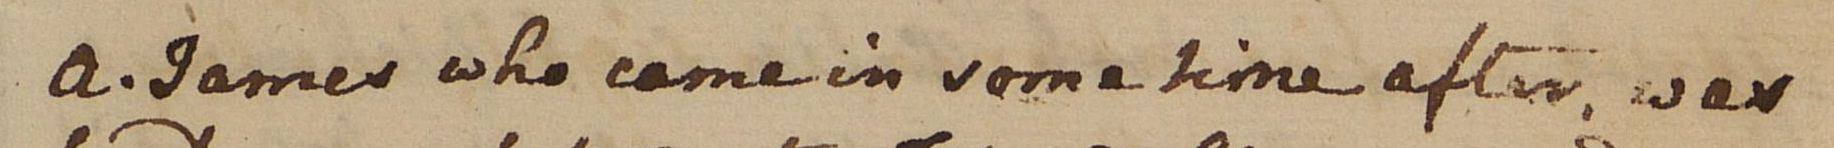A. James who came in some time after, was
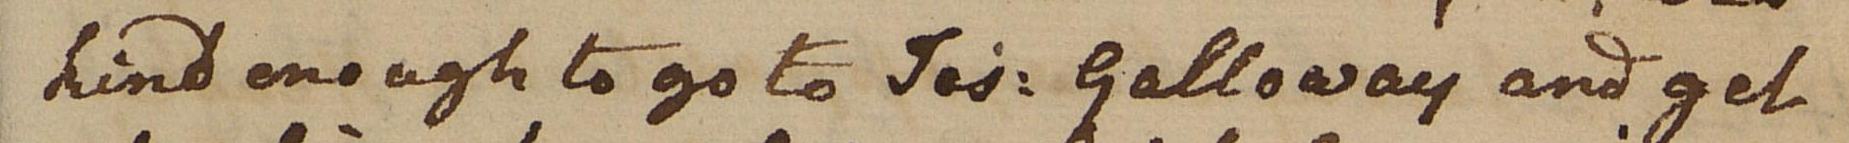kind enough to go to Jos: Galloway and get
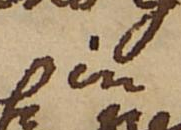in
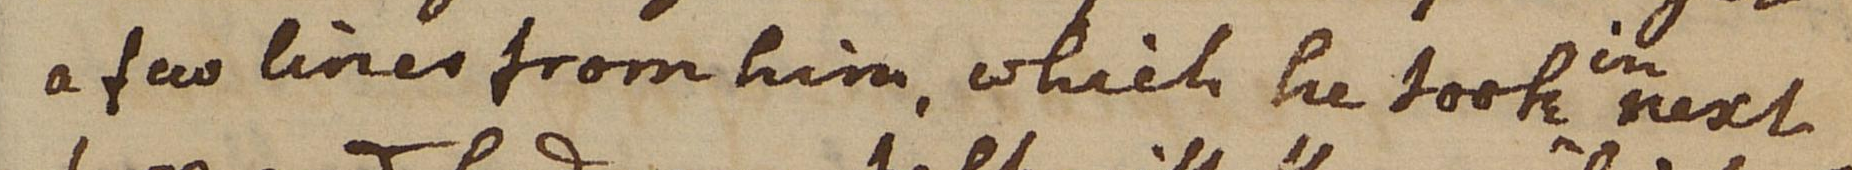a few lines from him, which he took ^ next
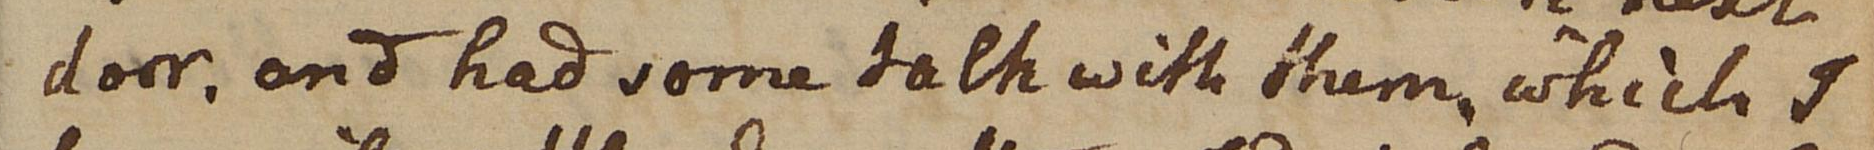door, and had some talk with them, which I
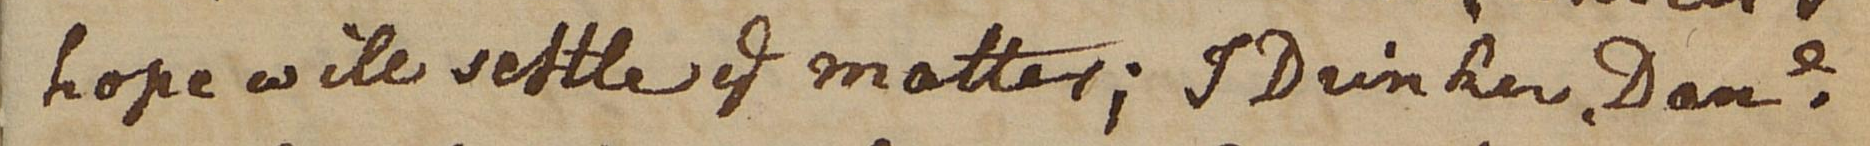hope will settle y^e matter; J Drinker, Dan^l.
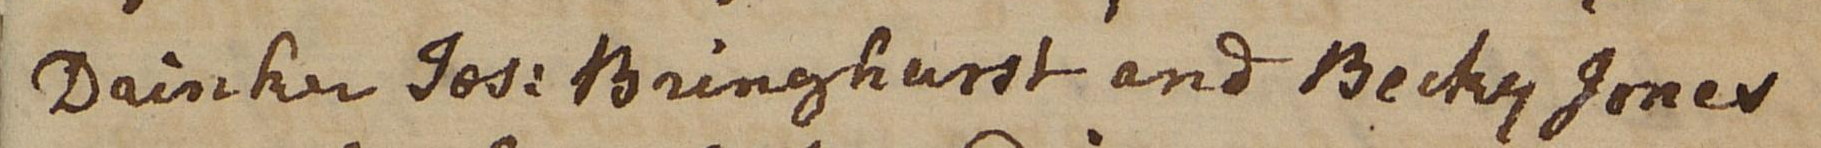Drinker Jos: Bringhurst and Becky Jones
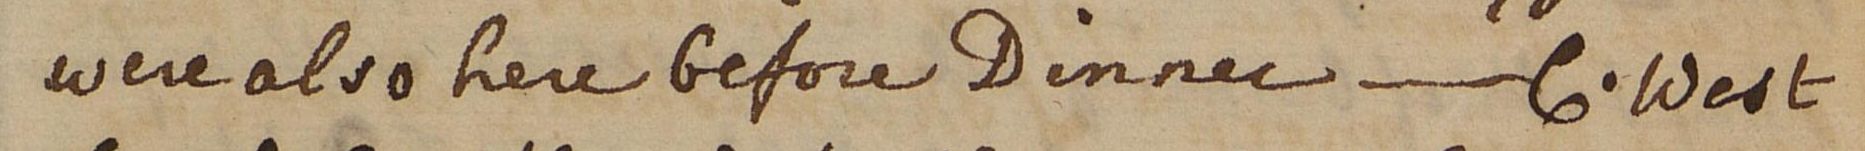were also here before Dinner- C. West
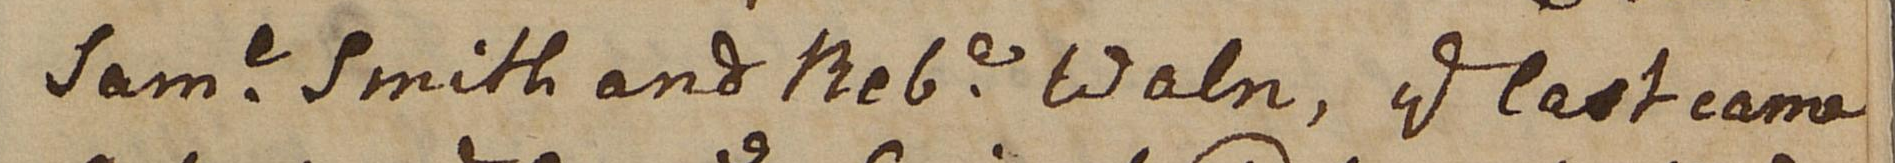Sam^l. Smith and Reb^a. Waln, y^e last came
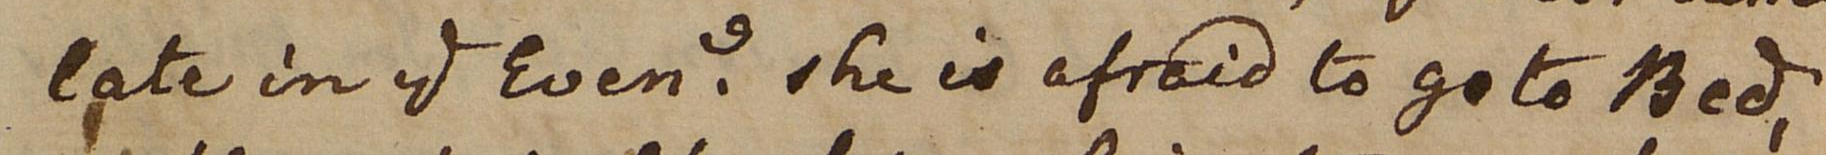late in y^e Even^g. she is afraid to go to Bed,
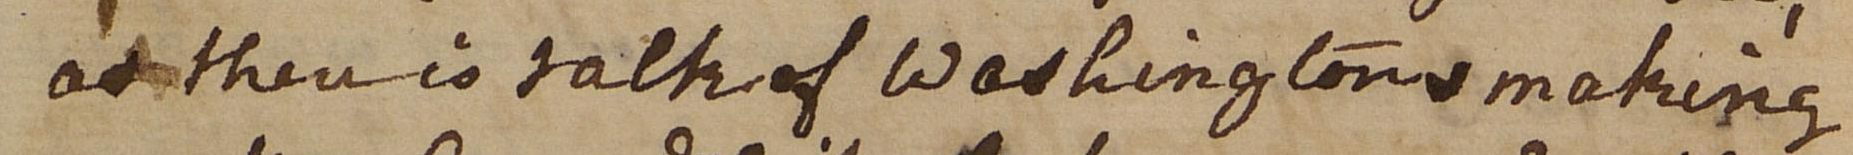as then is talk of Washingtons making
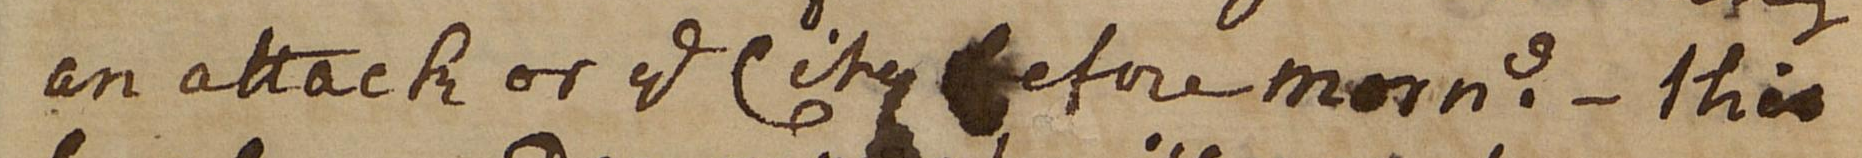an attack or y^e City [b]efore morn^g.- this
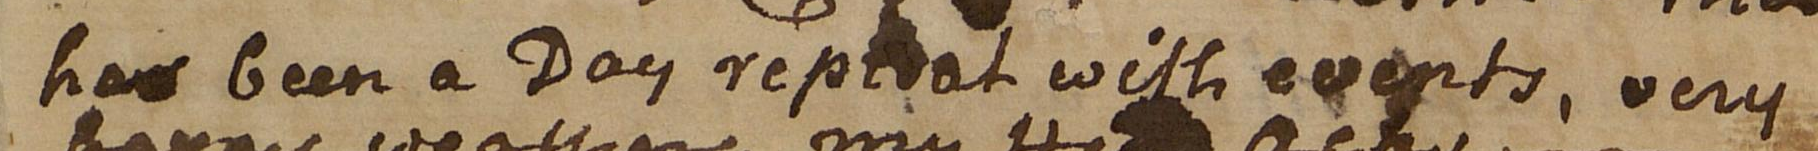he been a Day repleat with events, very
